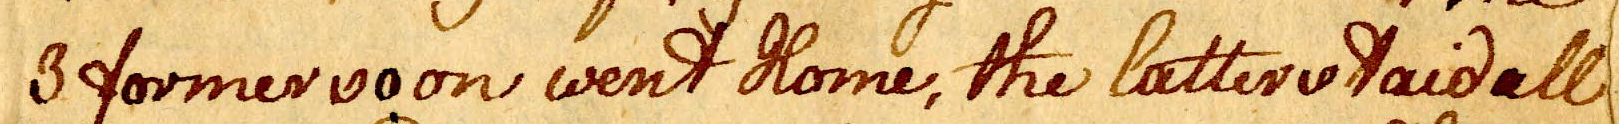3 former soon went Home, the latter staid all
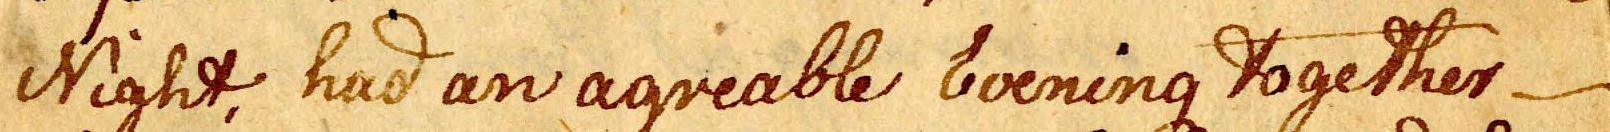Night, had an agreable Evening together -
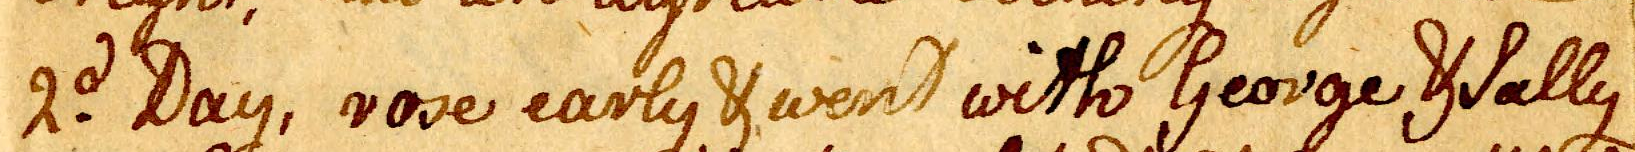2^d Day, rose early & went with George & Sally
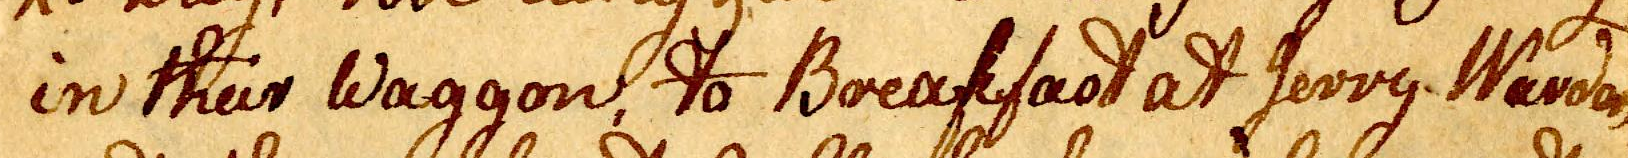in their Waggon, to Breakfast at Jerry Warder
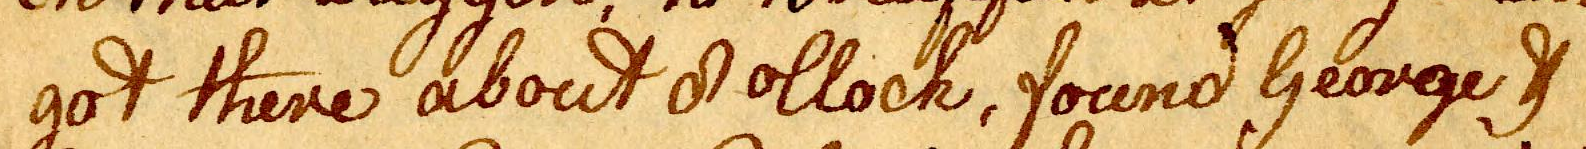go there about 8 ^oClock, found George &
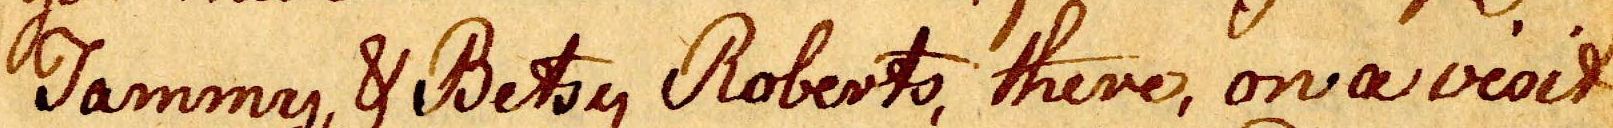Tammy, & Betsy Roberts, there, on a visit
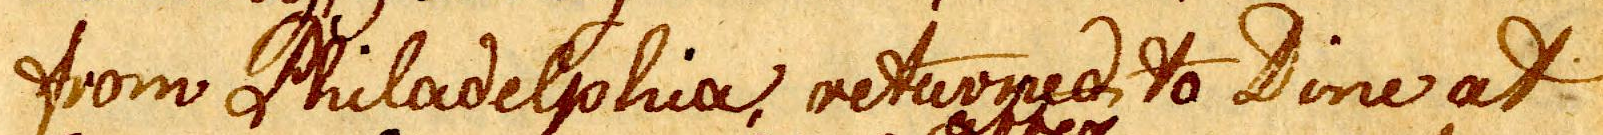from Philadelphia, returned to Dine at
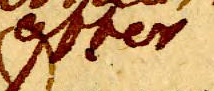after
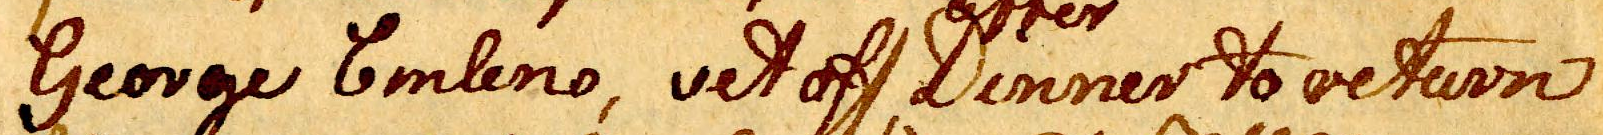George Emlens, set off ^ Dinner to return
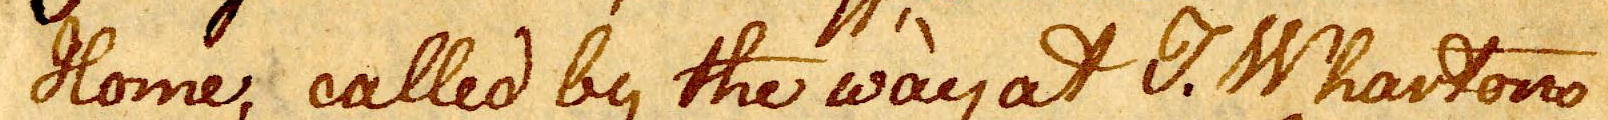Home, called by the way at T. Whartons
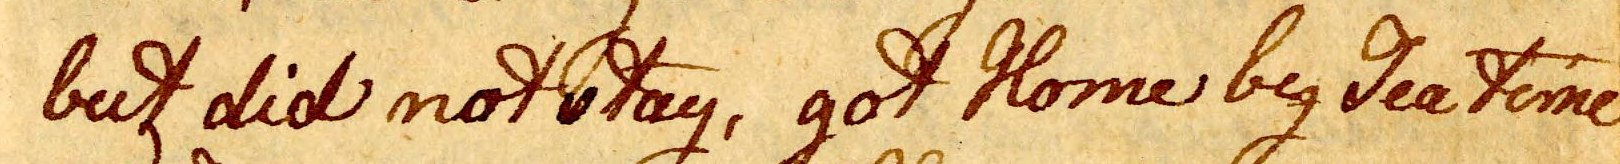but did not stay, got Home by Tea time
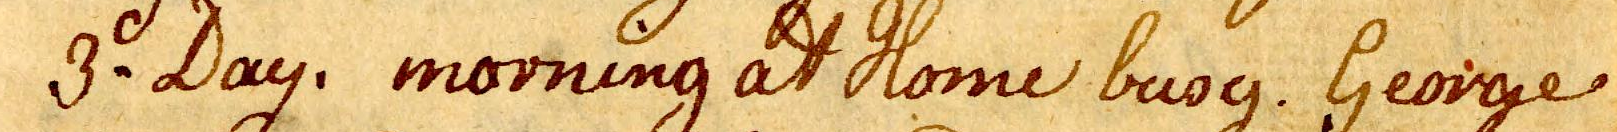3^d Day. morning at Home busy. George
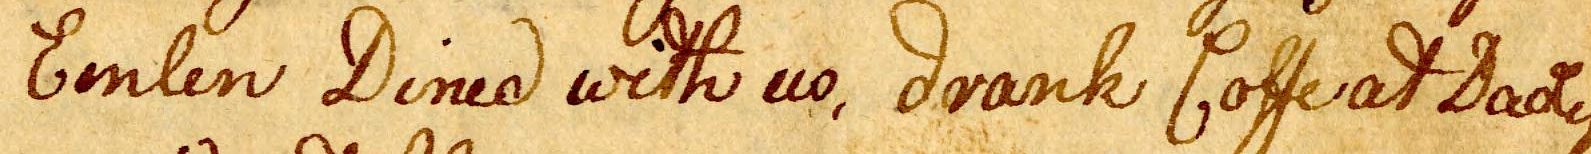Emlen Dined with us, drank Coffe at Dady
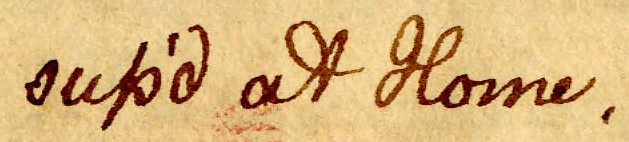sup'd at Home,
